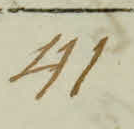41
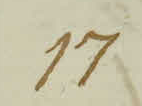17
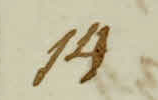14
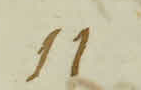11
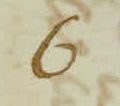6
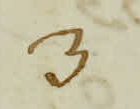3
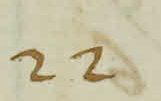22
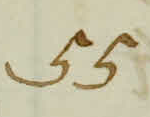55
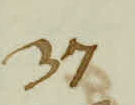37
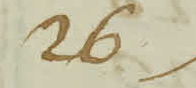26
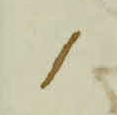1
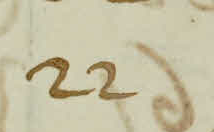22.
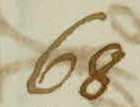68
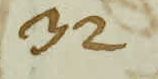32
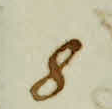8
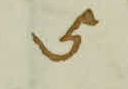5
